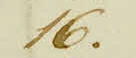16.
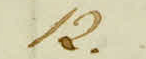12.
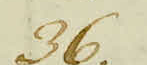36.
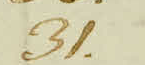31.
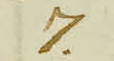7.
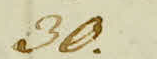30.
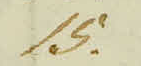15.
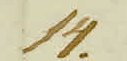14.
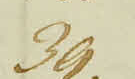39.
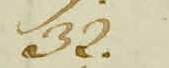32.
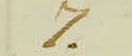7.
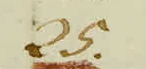25.
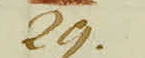29.
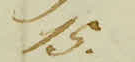15.
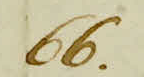66.
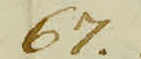67.
